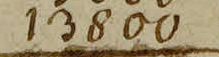13800
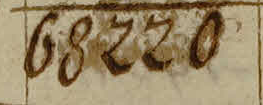68220
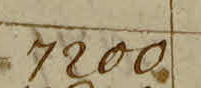7200
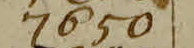7650
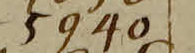5940
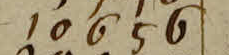10656
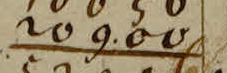20900
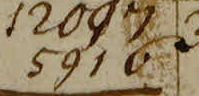5916
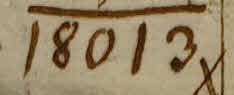18013
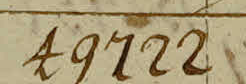49722
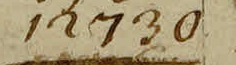12730
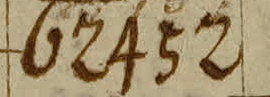62452
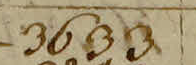3633
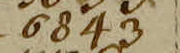6843
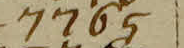7765
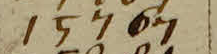15767
